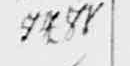5451
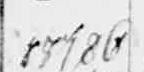12786
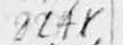3241
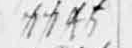7745
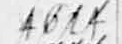4624
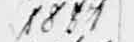1857
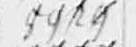5929
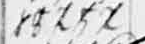15252
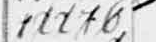12276
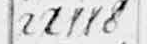22118
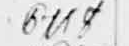6718
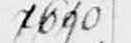7690
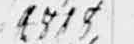4515
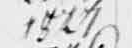1527
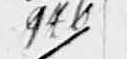946
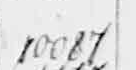10087
